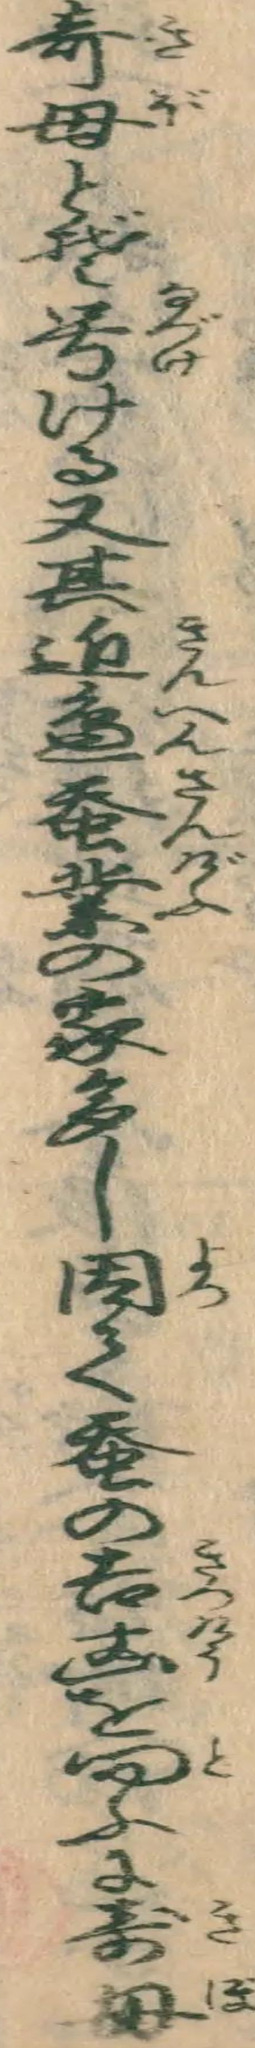奇母とぞ号ける又其近辺蚕業の家多し因て蚕の吉凶を問ふに奇母
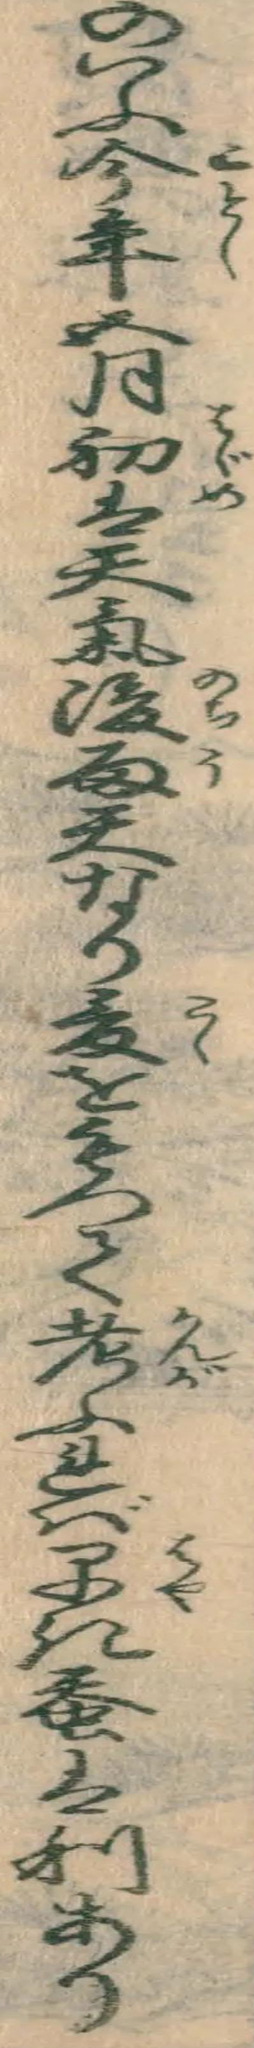のいふ今年五月初は天気後雨天なり爰をもって考ふれば早き蚕は利あり
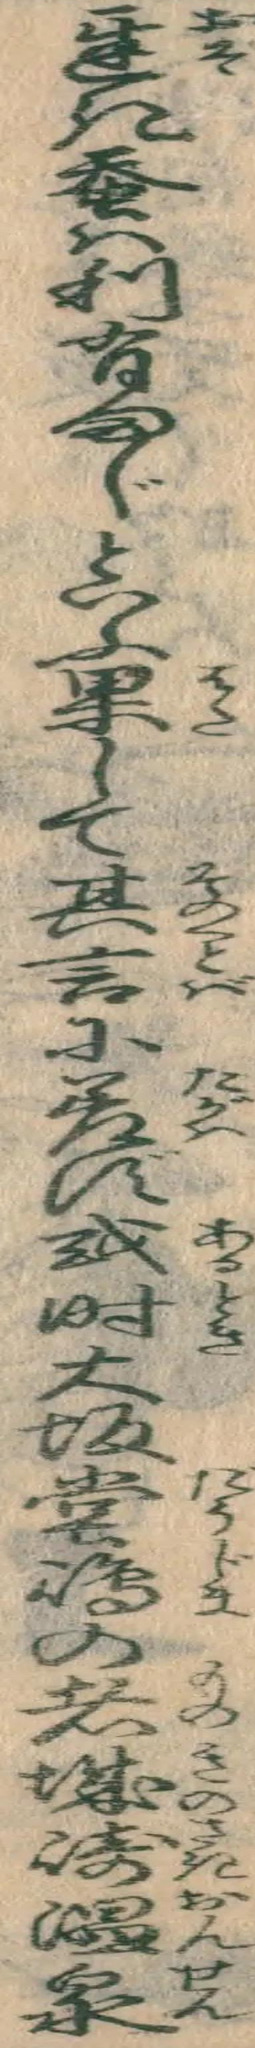遅き蚕は利有まじといふ果して其言に差ず或時大坂堂嶋の者城崎温泉
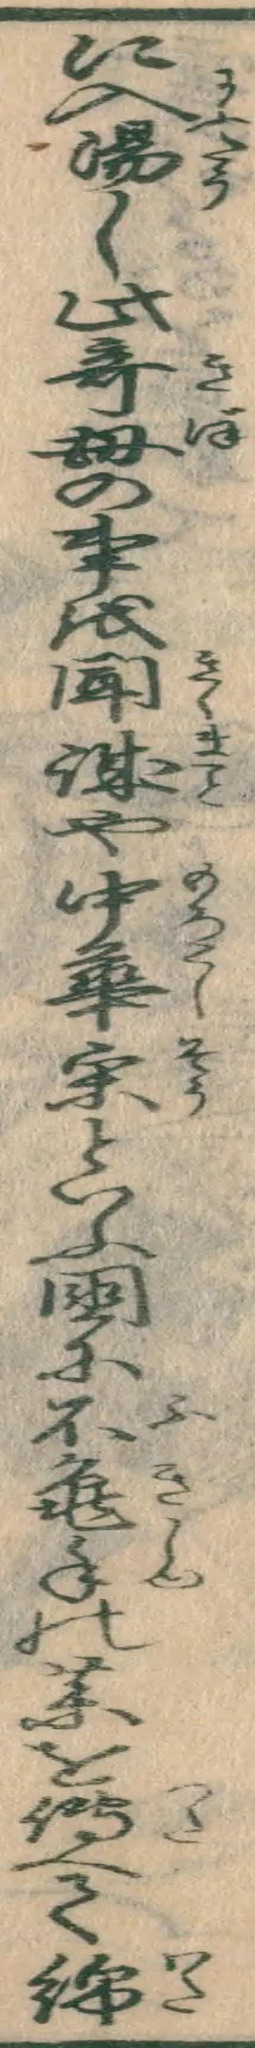に入湯し此奇母の事を聞誠や中華宋といふ国に不亀手の薬を伝へて綿
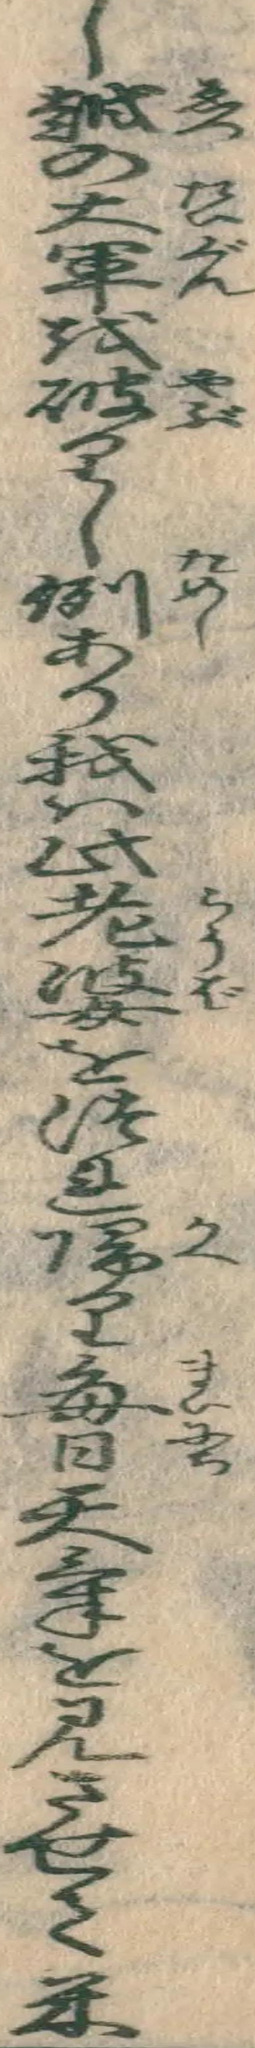し越の大軍を破りし例あり我は此老婆をつれ帰り毎日天気を見させて米
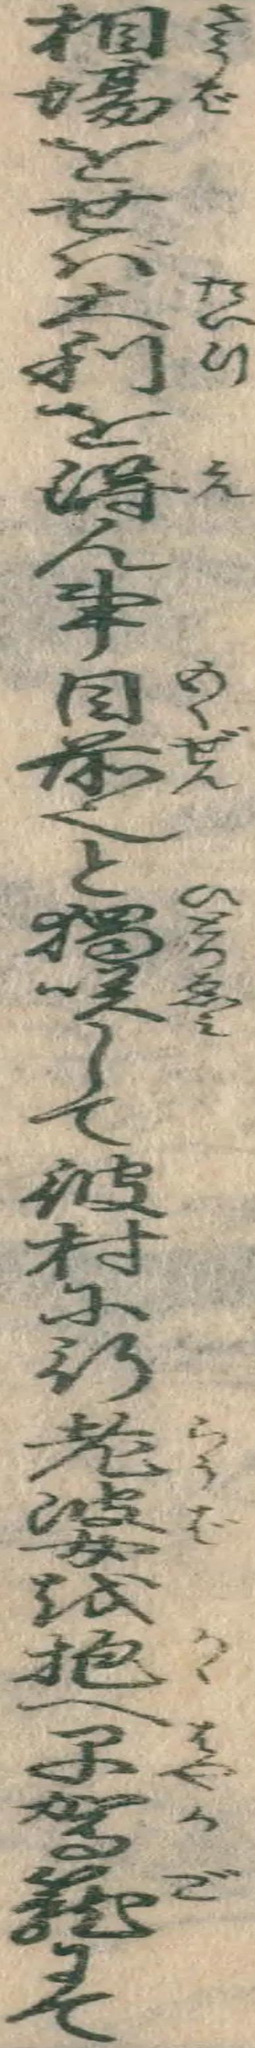相場をせば大利を得ん事目前也と毒咲して彼村に行老婆を抱へ早駕籠にて
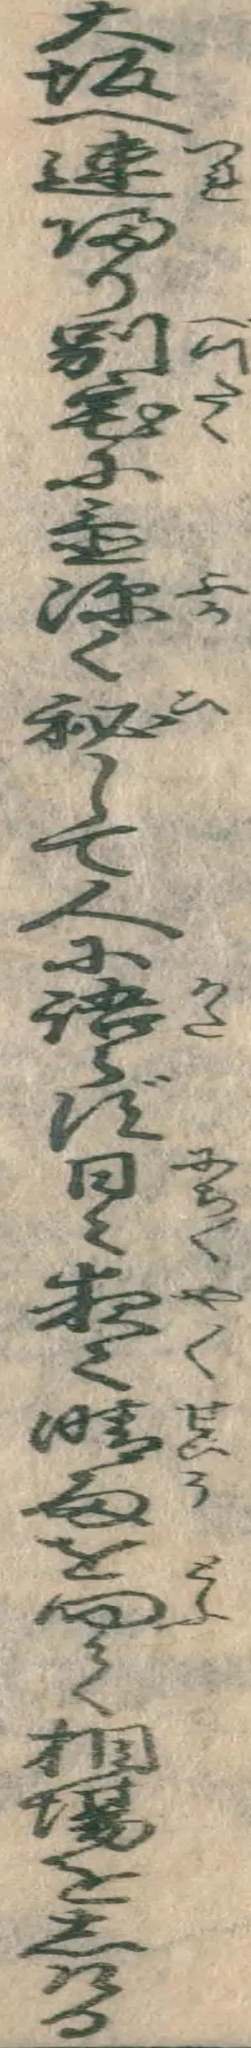大坂へ連帰り別宅に置深く秘して人に語らず日々夜々晴雨を問て相場をしける
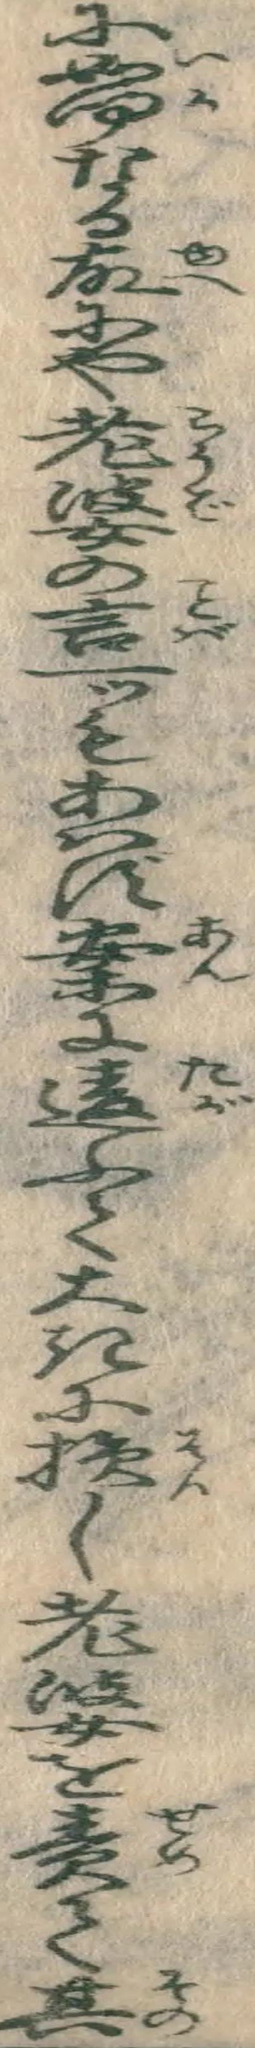に如何なる故にや老婆の言一ツもあはず案に違ふて大きに損し老婆を責て其
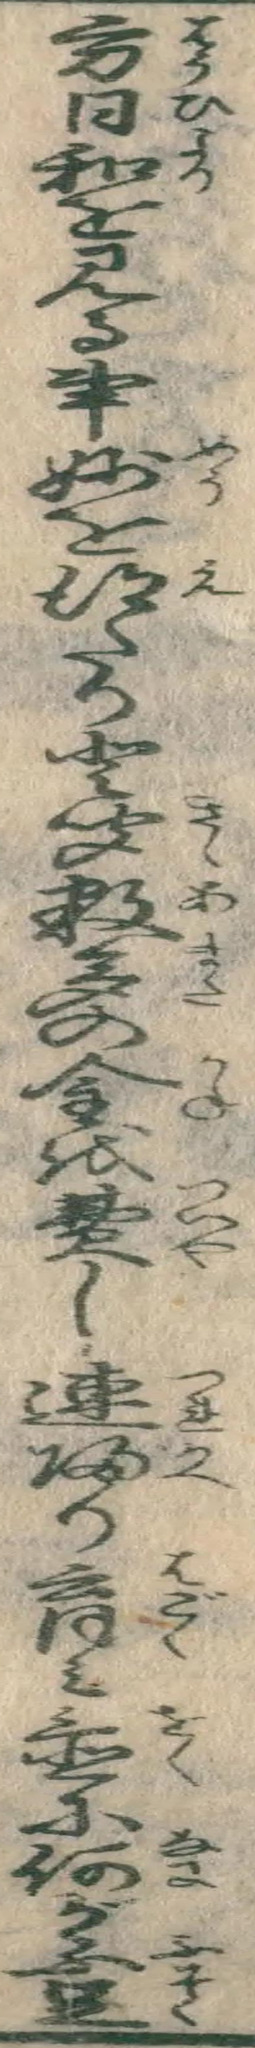方日和を見る事妙を得たりと聞数多の金を費し連帰り育み置に何が不足
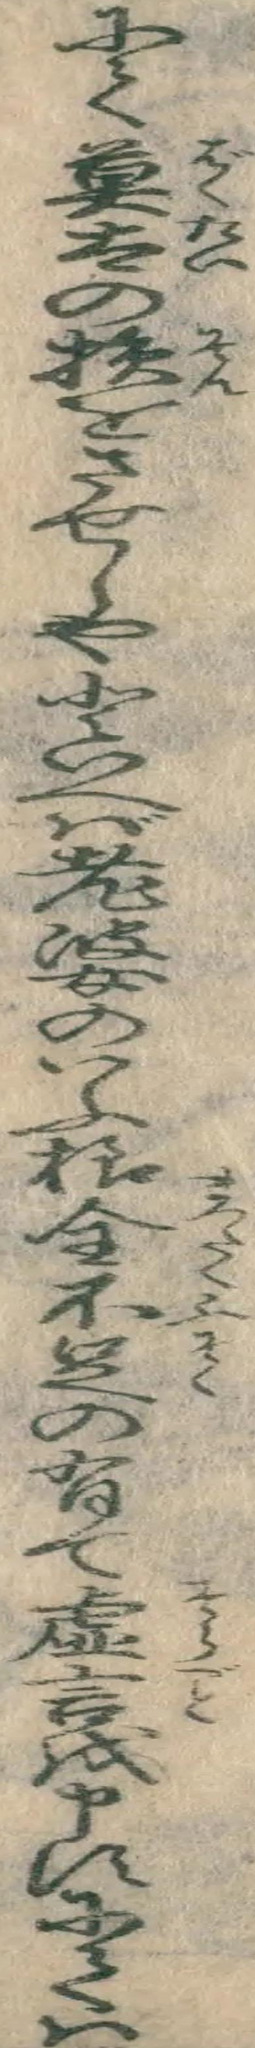にて莫太の損をさせしやといヘば老婆のいふ様全不足の有て虚言を申すにては
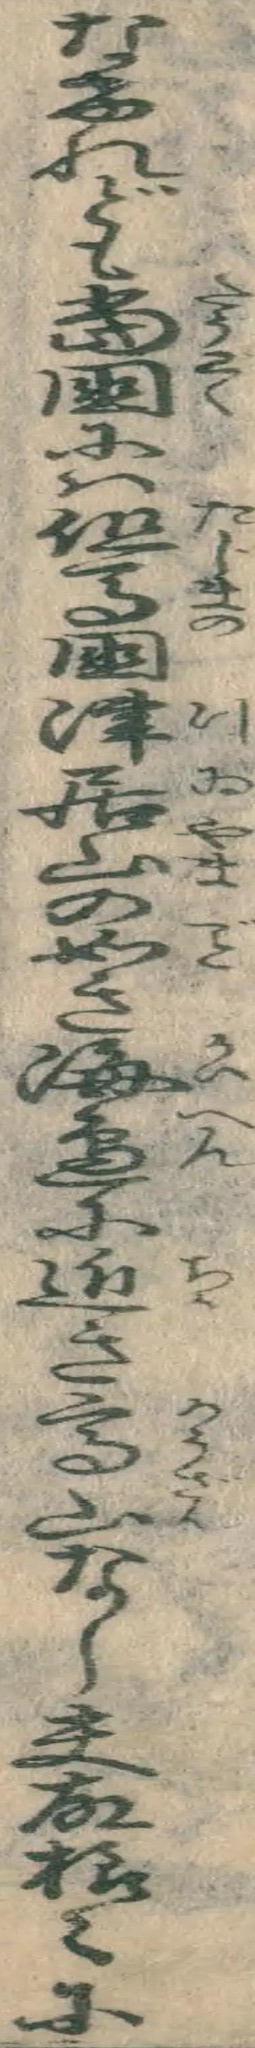なけれども当国には但馬国津居山の如き海辺に近き高山なし夫故様々に

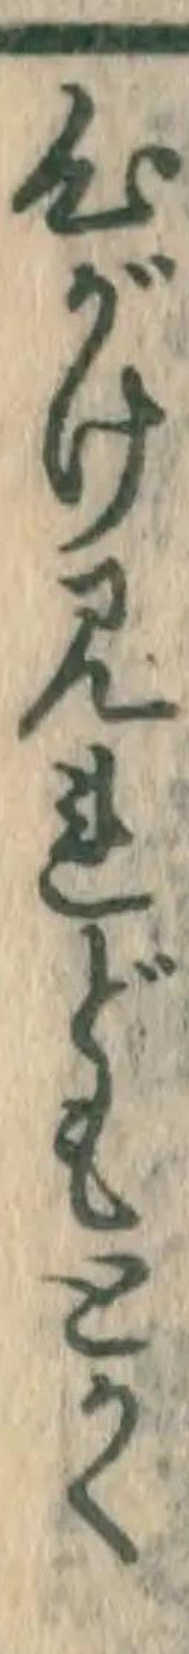心がけ見れどもとかく
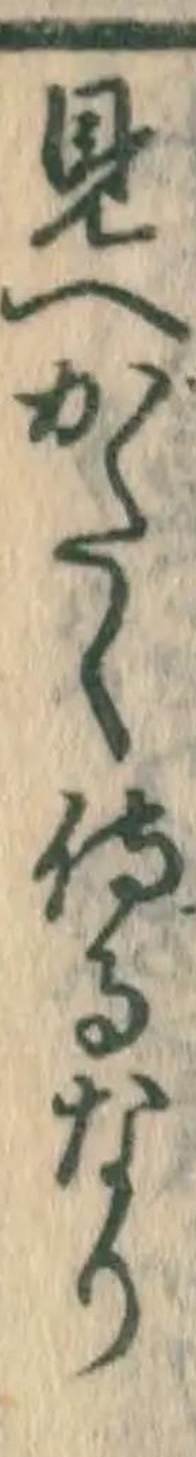見へがたく侍るなり
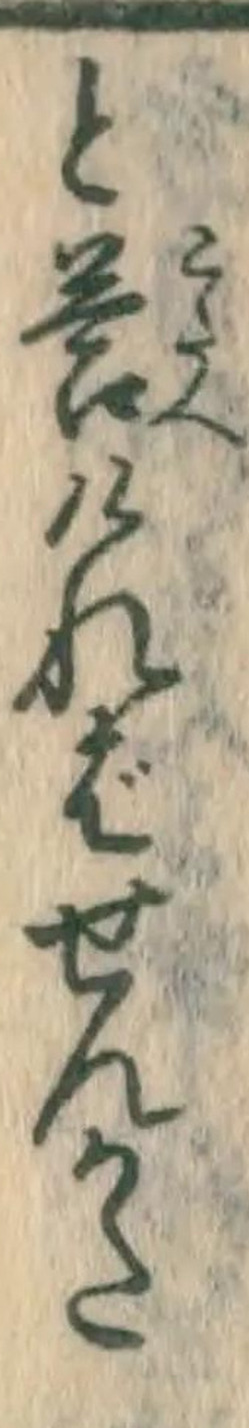と答ければせんかた
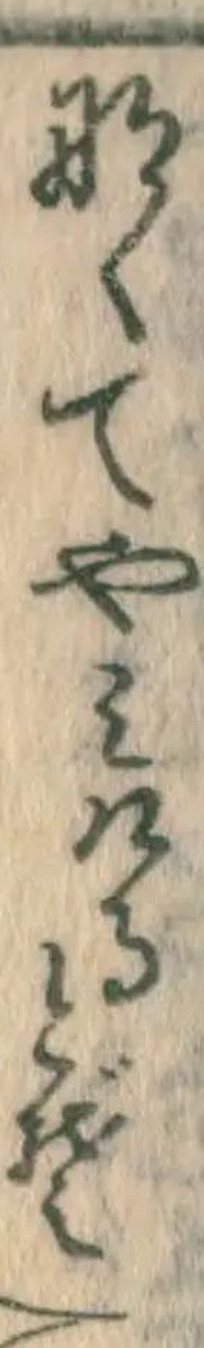なくてやみけるとぞ
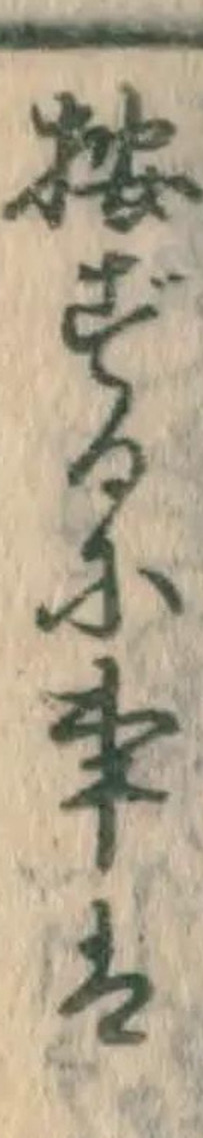按ずるに事は
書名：養蚕秘録 3巻. [3]
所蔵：国立国会図書館 National Diet Library, JAPAN
